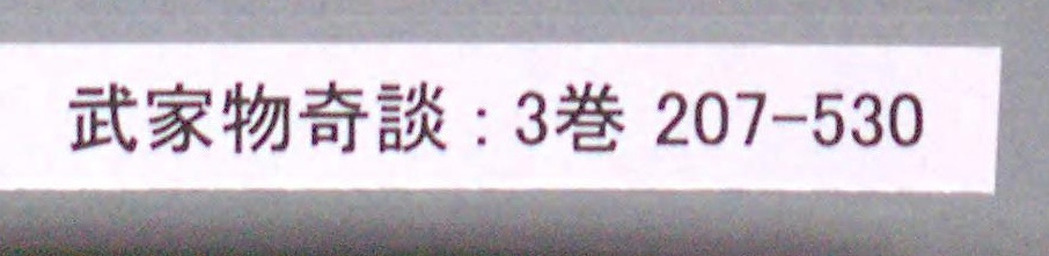武家物奇談
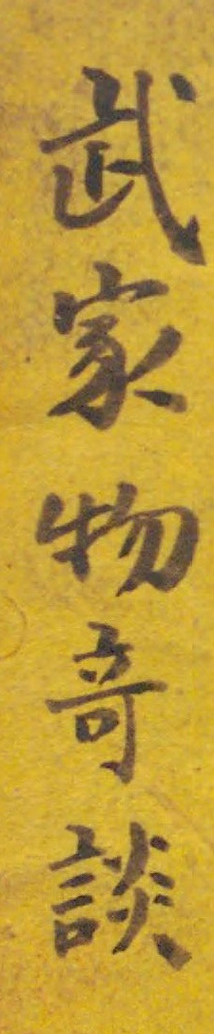武家物奇談

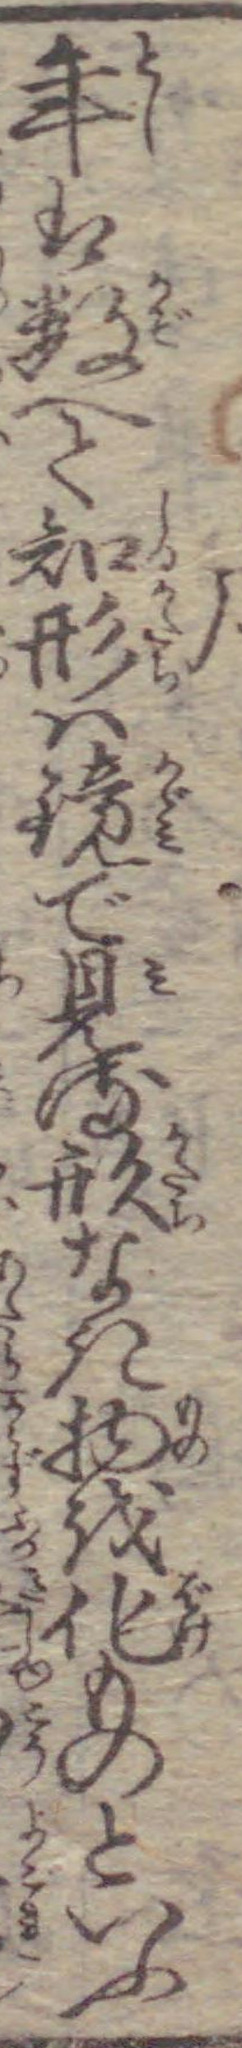年は数へて知形は鏡で見る形なき物を化ものといふ
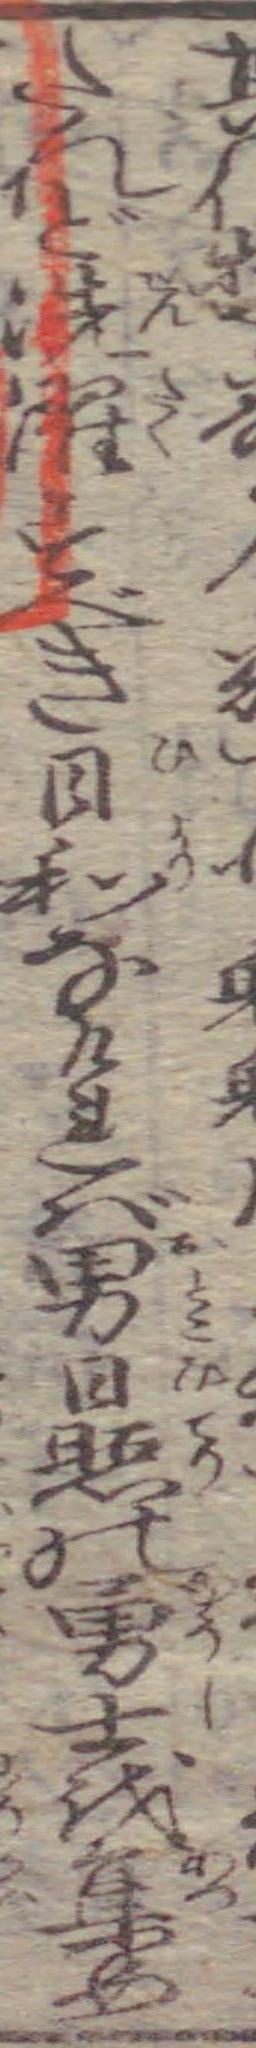たれど洗濯すべき日和なければ男日照の勇士を集め
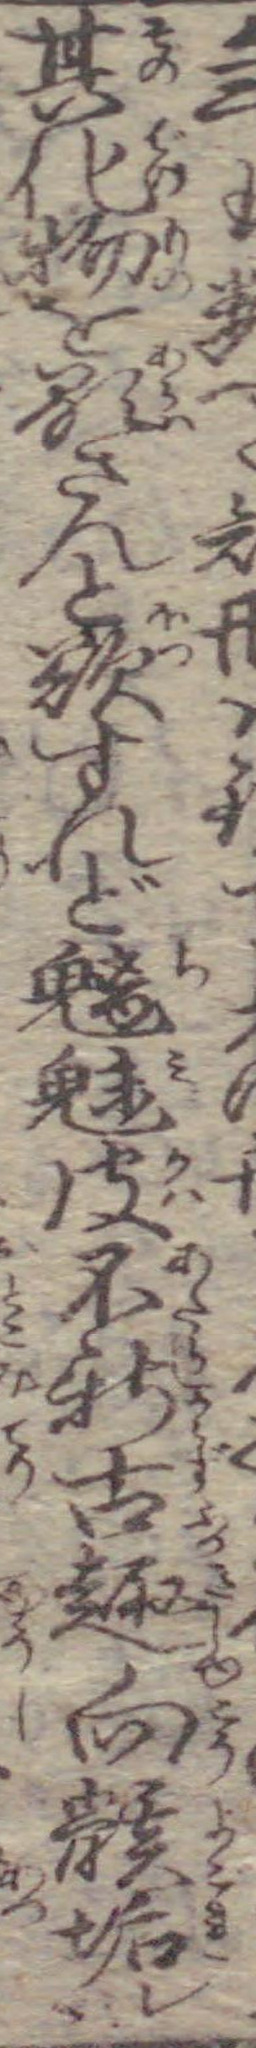其化物を顕さんと欲すれど魑魅皮不新古趣向骸垢れ
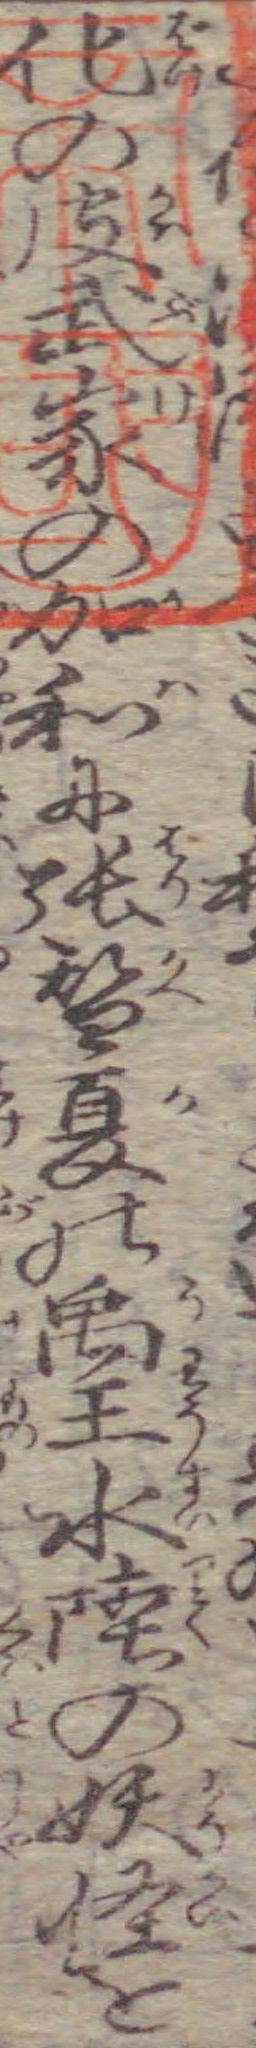化の皮武家の加和に張替夏の禹王水陸の妖怪を
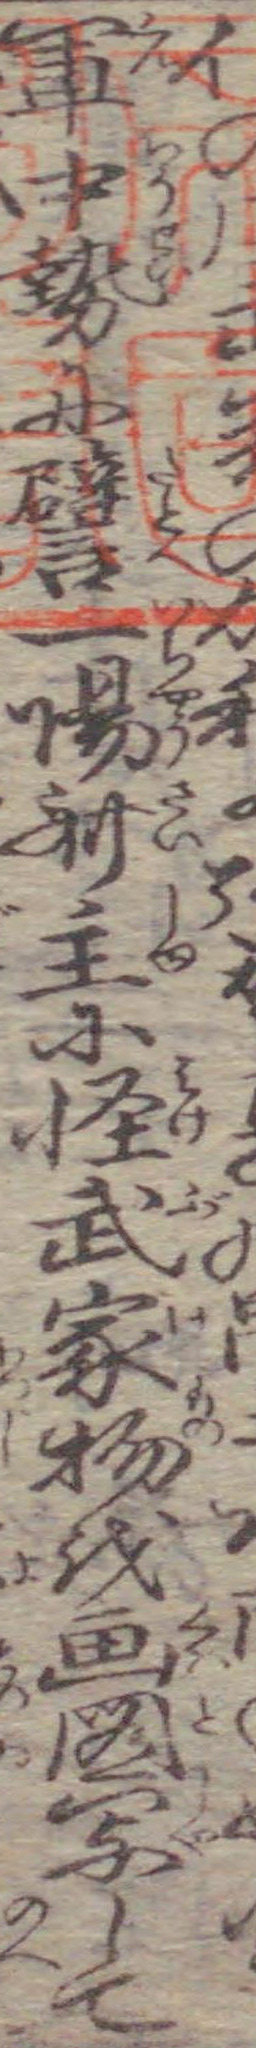軍中勢に譬一陽斎主に怪武家物を画図写して
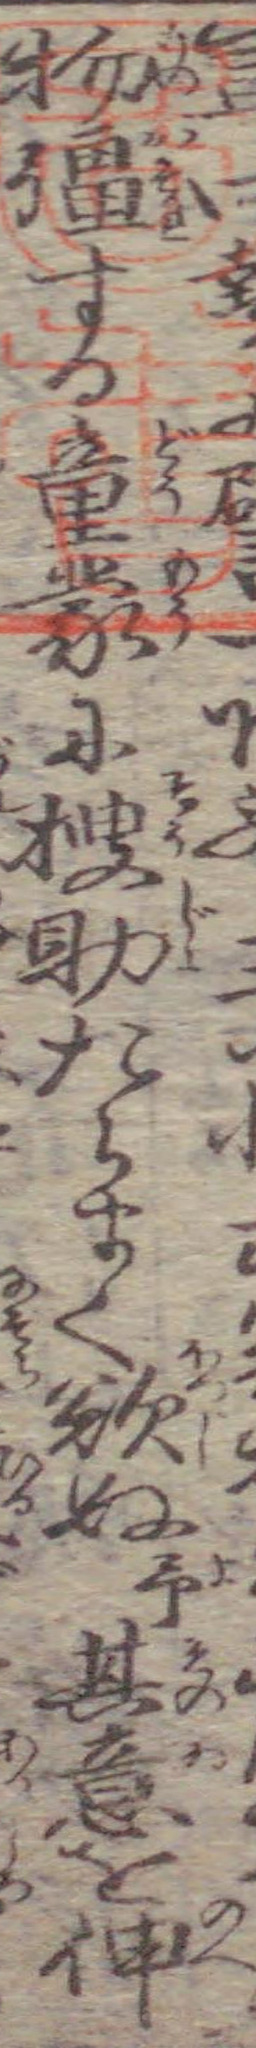物疆する童蒙に捜助たらまく欲ぬ予其意を伸
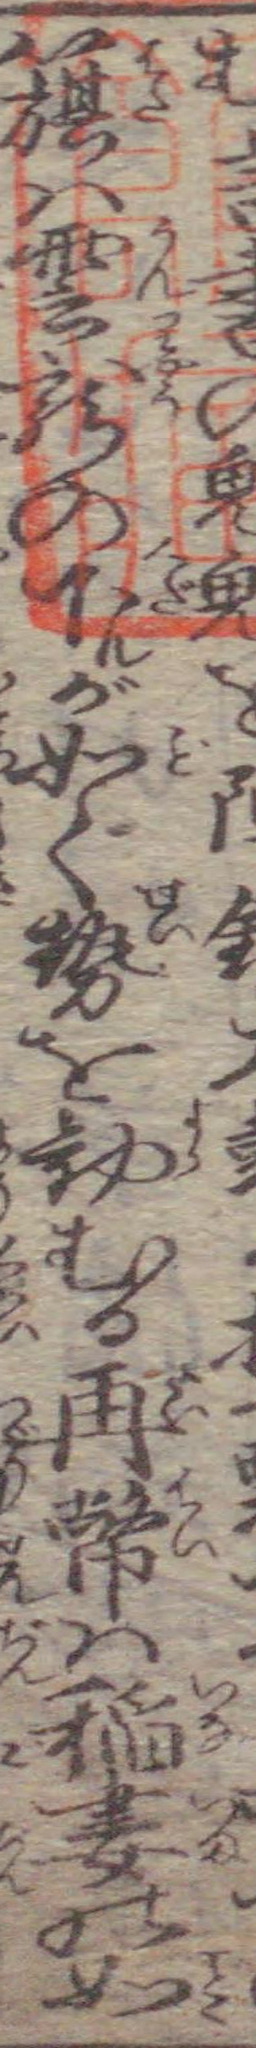籏は雲龍の下るが如く勢を勧むる再幣は稲妻の如
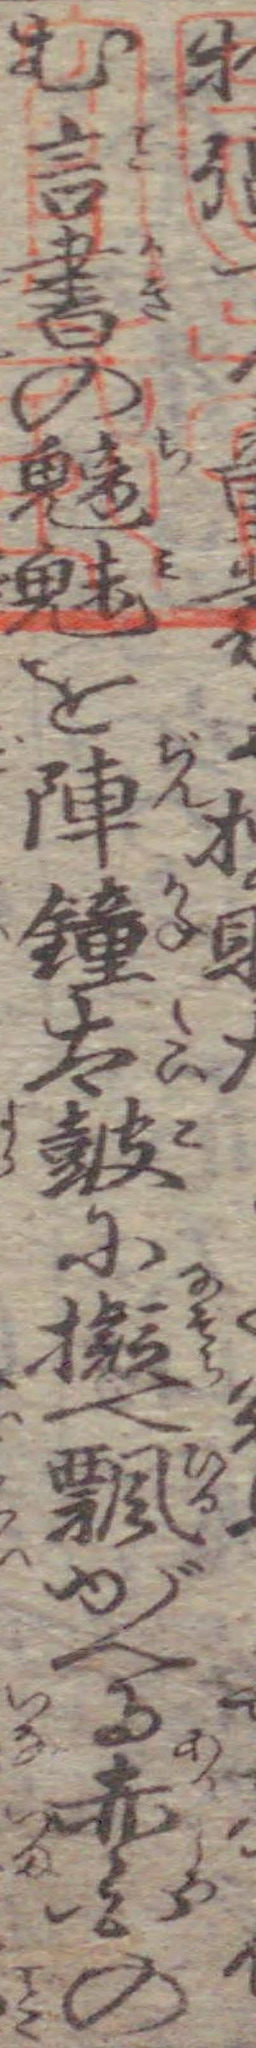む言書の魑魅を陣鐘太皷に擬へ飄がへる赤白の
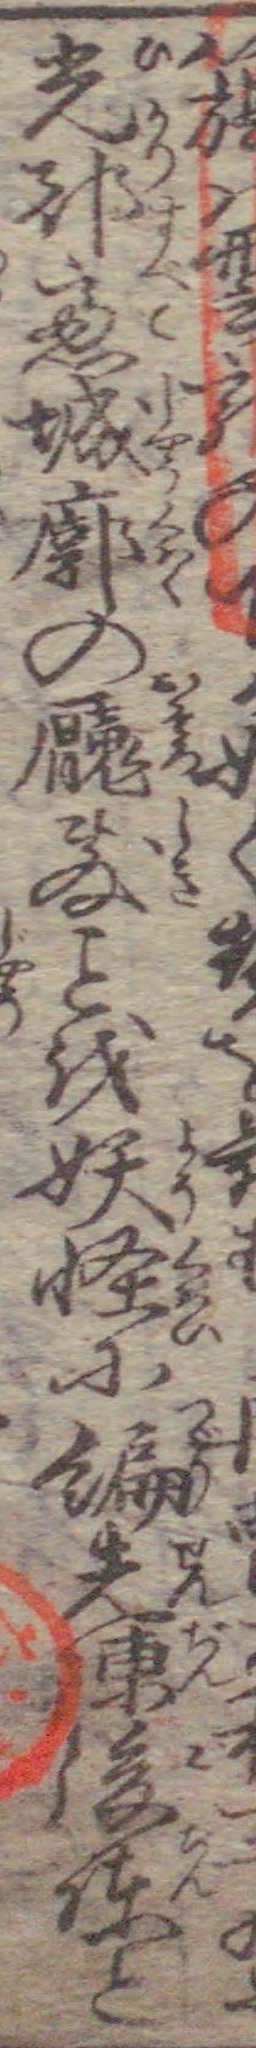光都慮城廓の魘敷ことを妖怪に編先陣後陣と
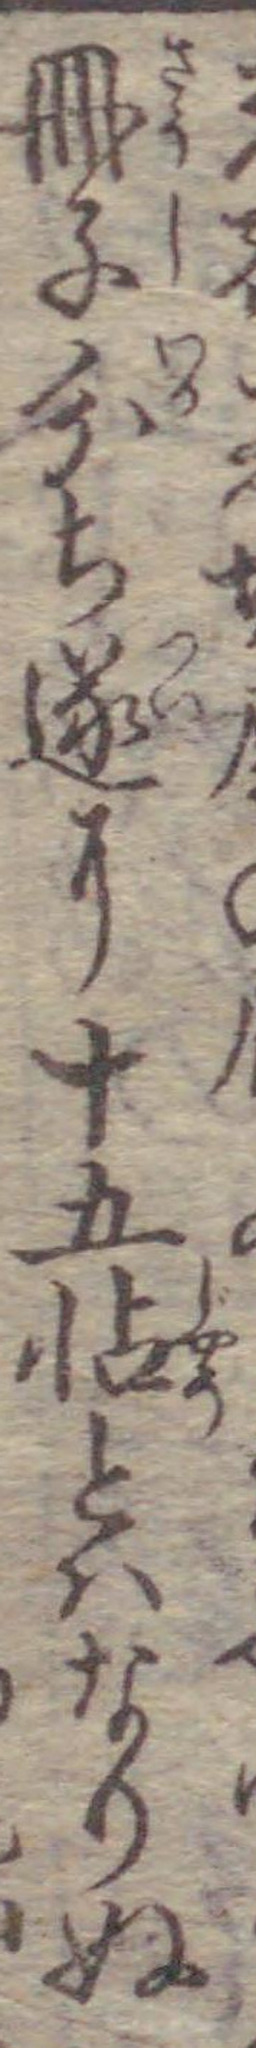冊子分ち遂に十五帖とはなりぬ

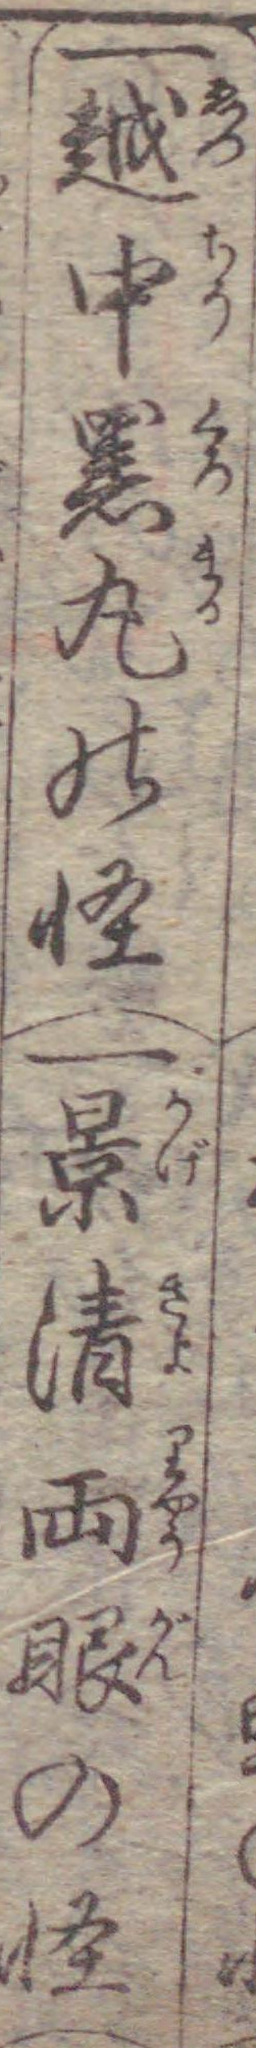一越中黒丸の怪
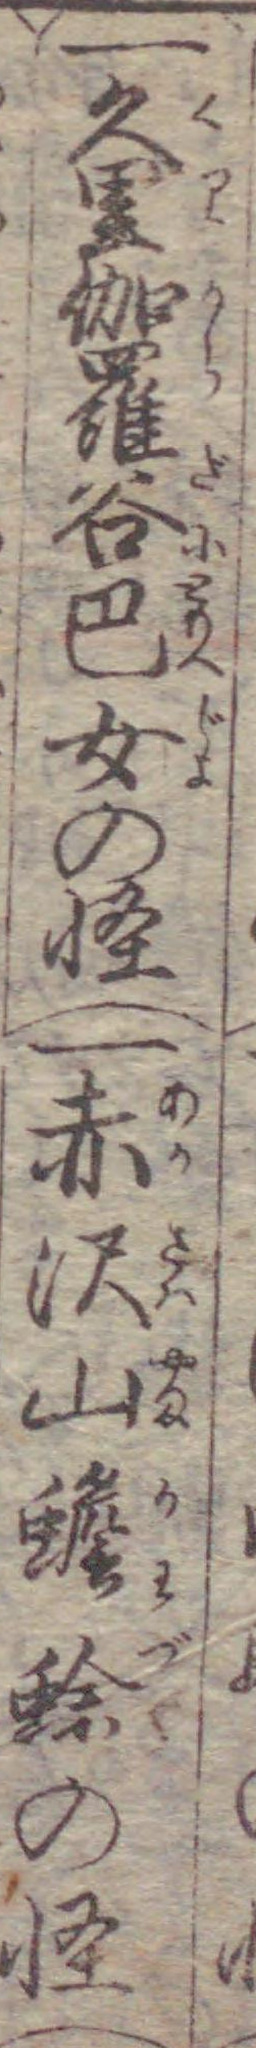一倶利伽羅谷巴女の怪
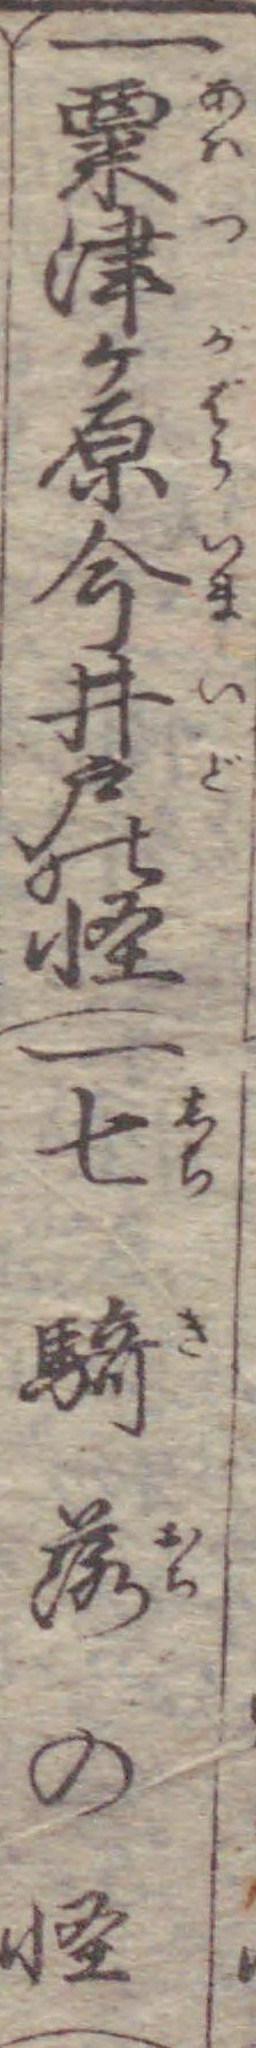一粟津ケ原今井戸の怪
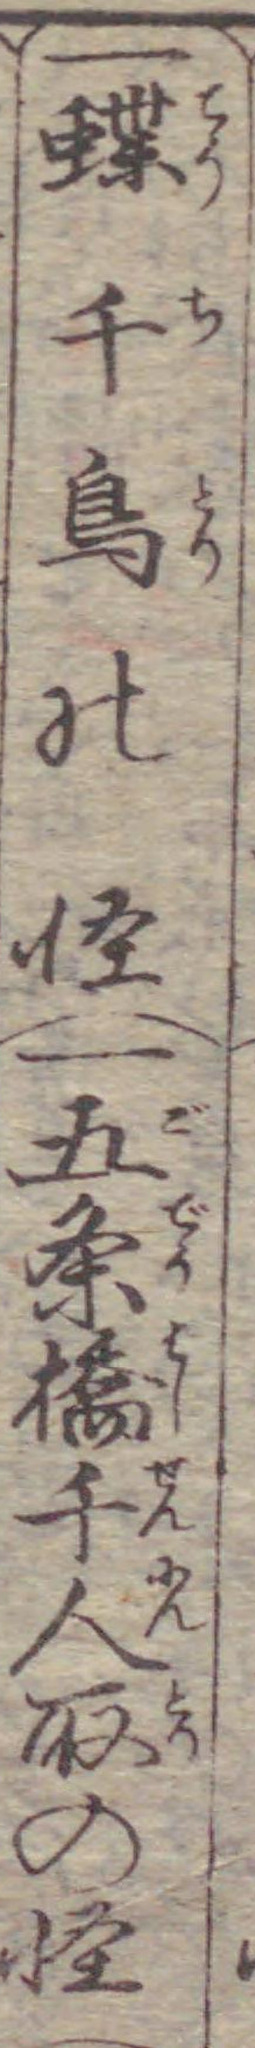一蝶千鳥の怪
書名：武家物奇談 : 3巻
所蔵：国立国会図書館 National Diet Library, JAPAN
